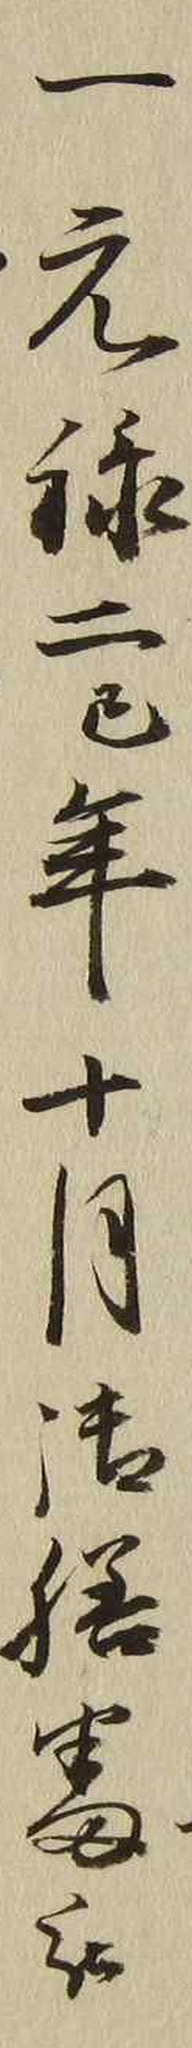一元禄二巳年十月御膳番被
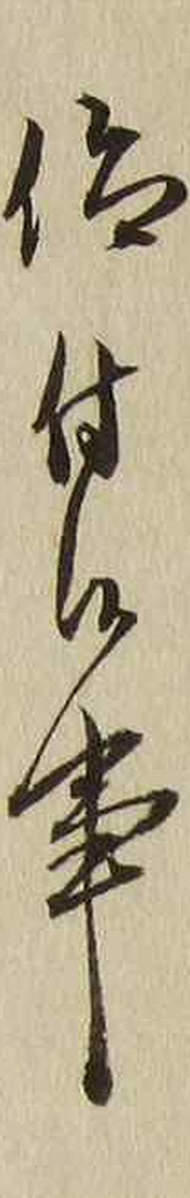仰付候事
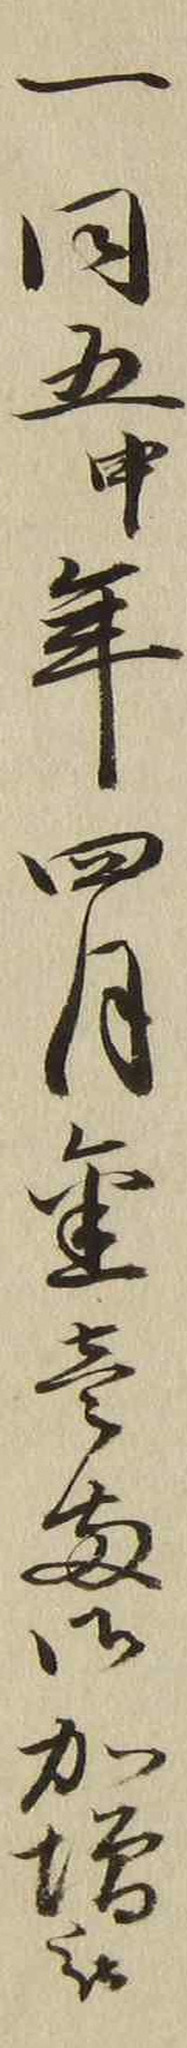一同五申年四月金壱両御加増被

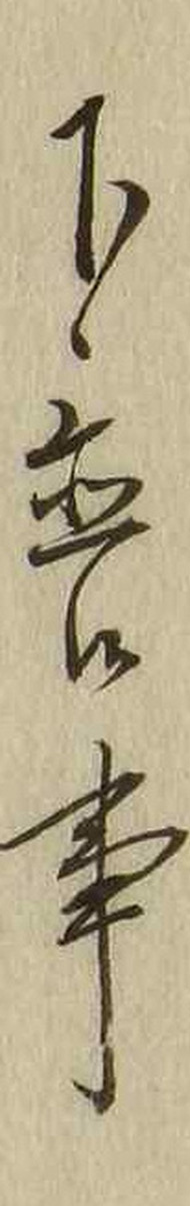下置候事
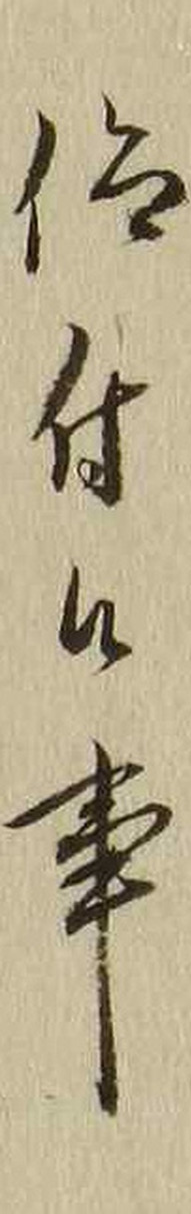仰付候事
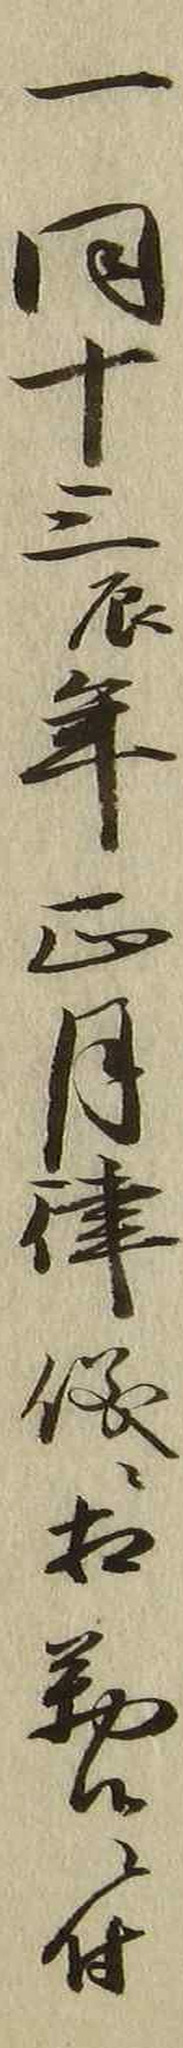一同十三辰年正月律儀ニ相勤候ニ付
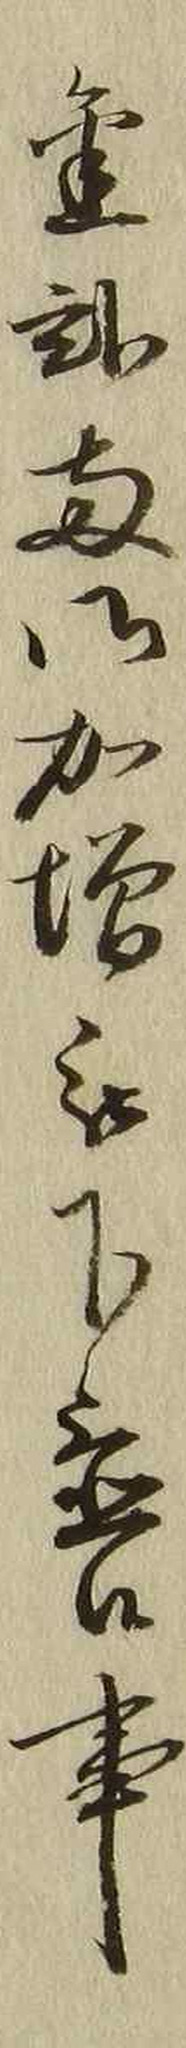金弐両御加増被下置候事
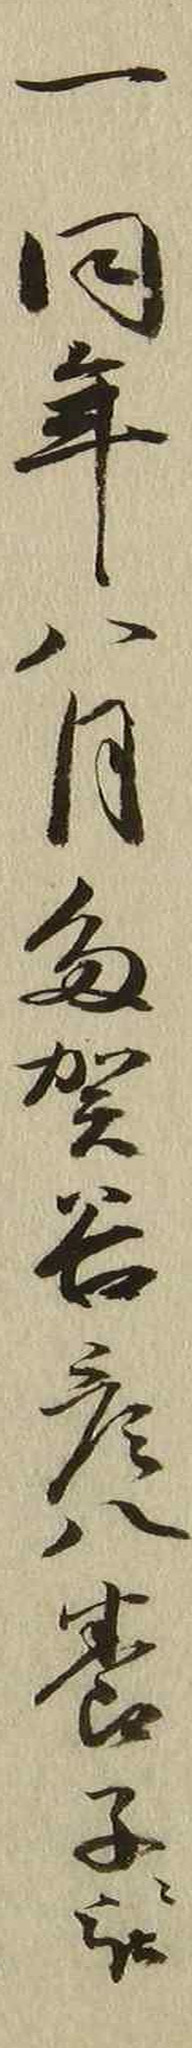一同年八月多賀谷彦八養子ニ被
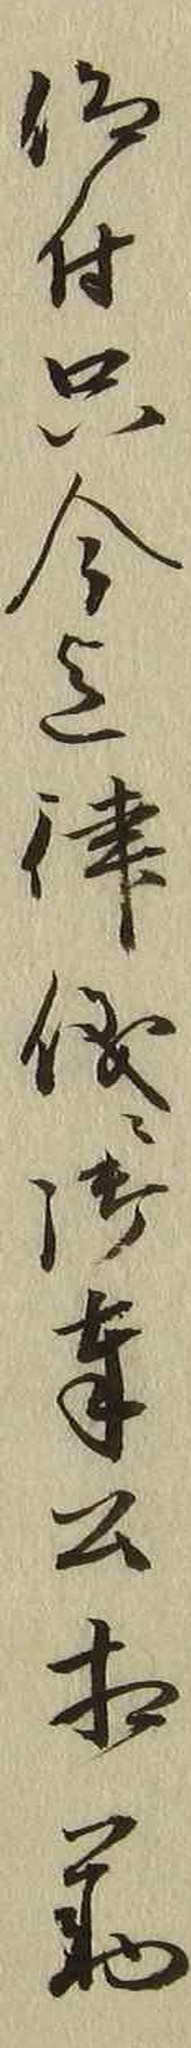仰付只今迄律儀ニ御奉公相勤
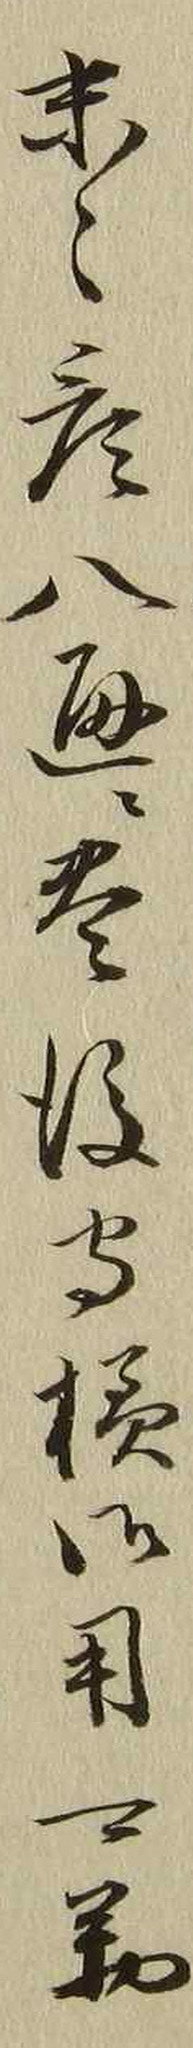末々彦八通ニ豊後守様御用可勤
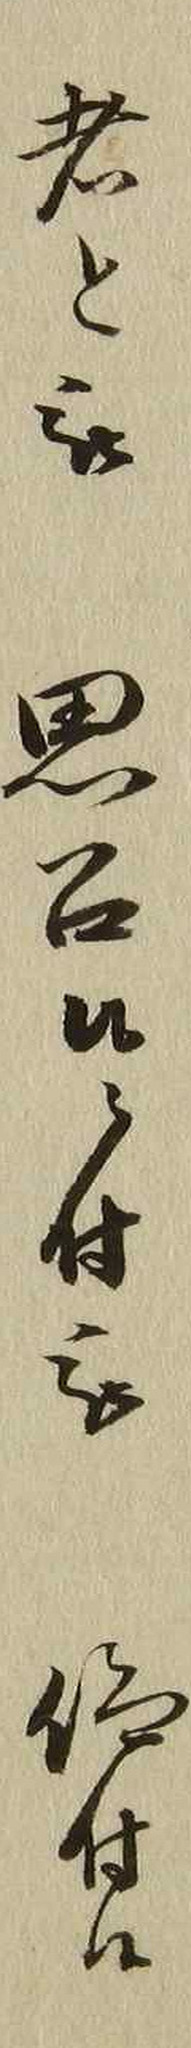者と被思召候ニ付被仰付候
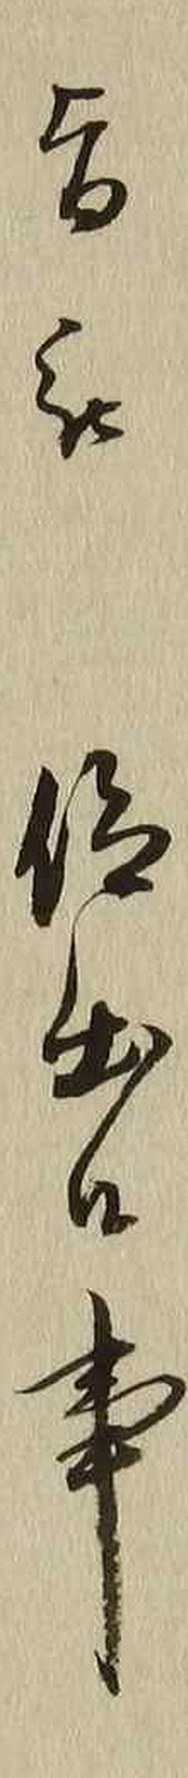旨被仰出候事
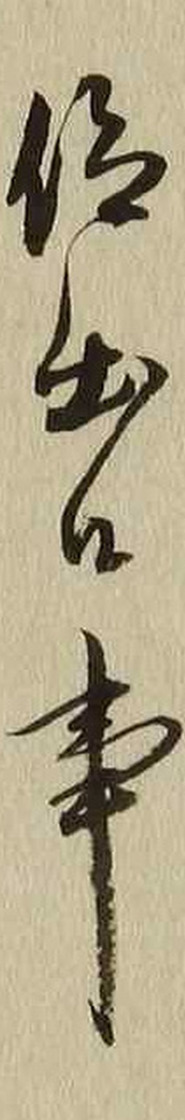仰付候事
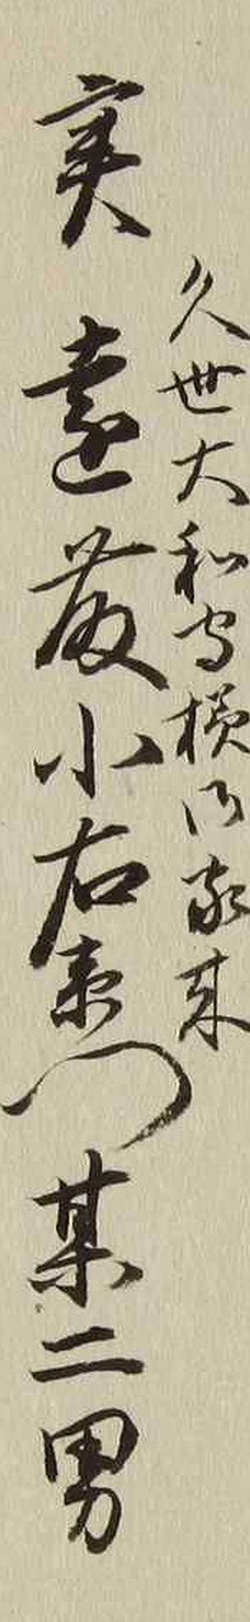実遠藤小右衛門某二男
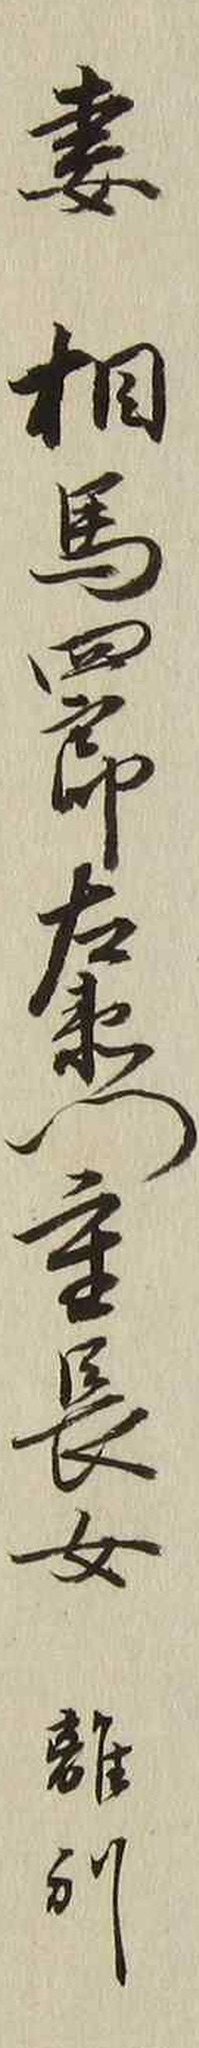妻相馬四郎左衛門重長女離別
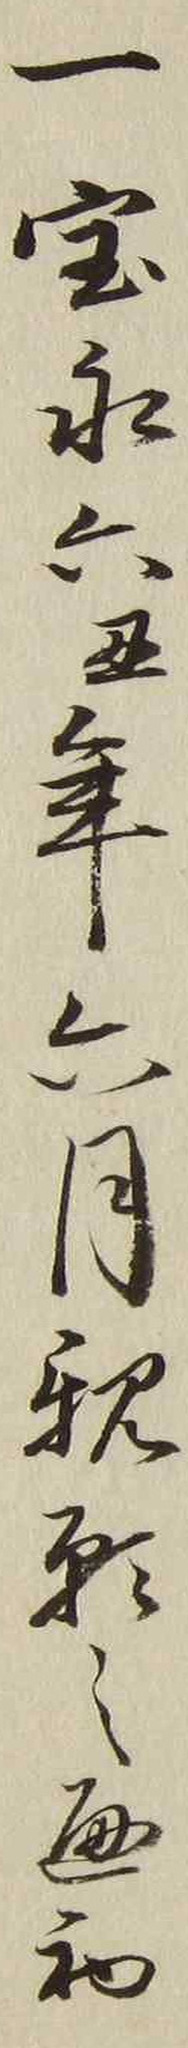一宝永六丑年六月親願之通初
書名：諸士系譜　巻之61　と之部4
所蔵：会津若松市立会津図書館
